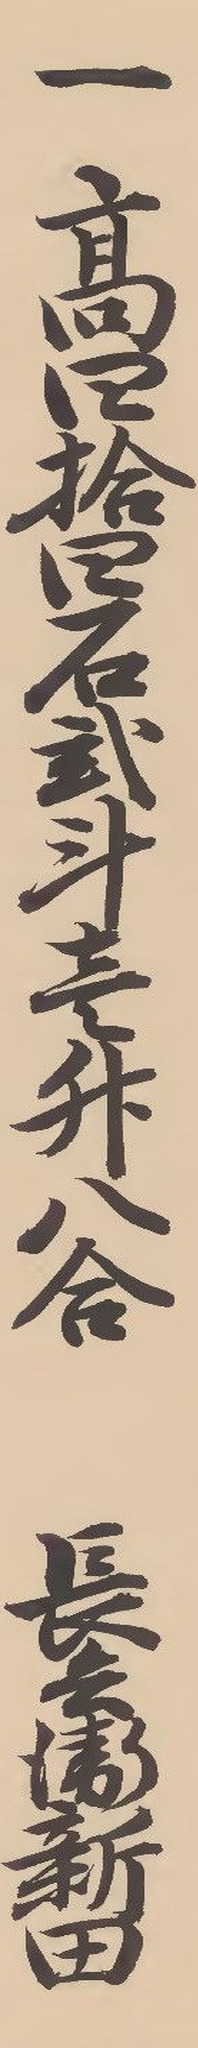一高四拾四石弐斗壱升八合長兵衛新田
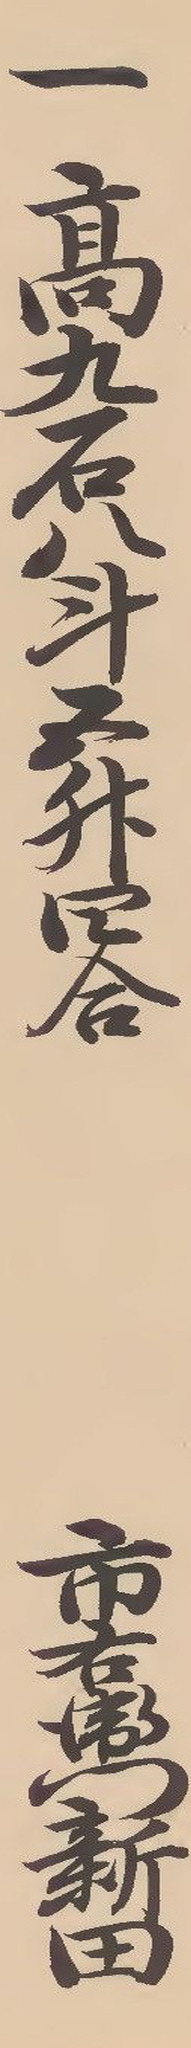一高九石八斗五升四合市右衛門新田
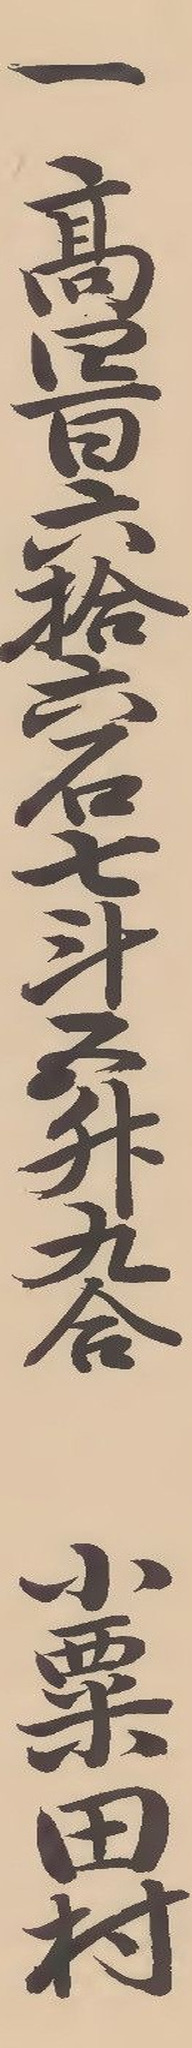一高四百六拾六石七斗五升九合小粟田村
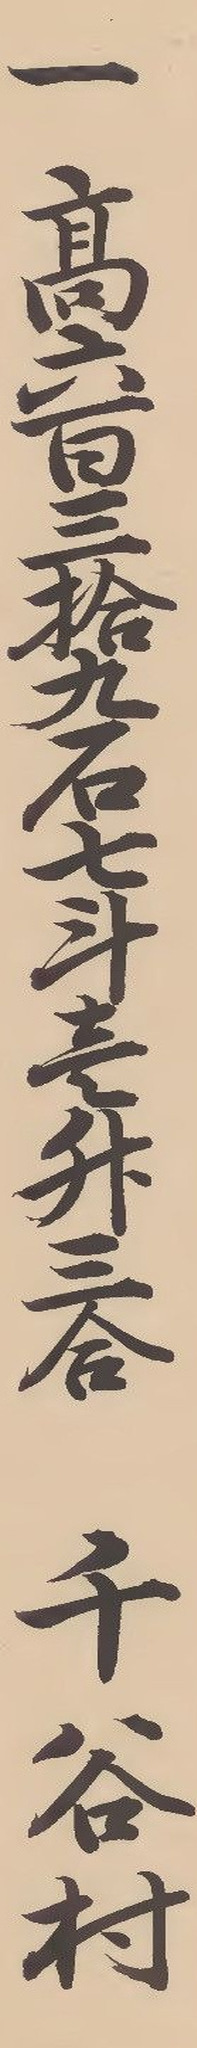一高六百三拾九石七斗壱升三合千谷村
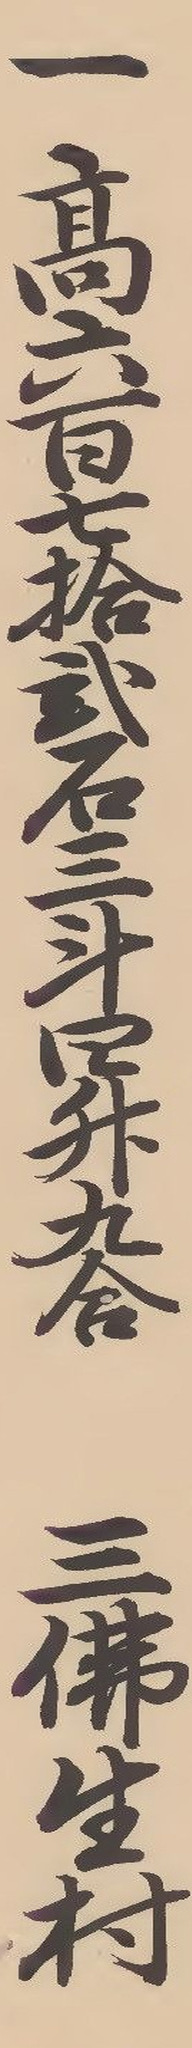一高六百七拾弐石三斗四升九合三仏生村

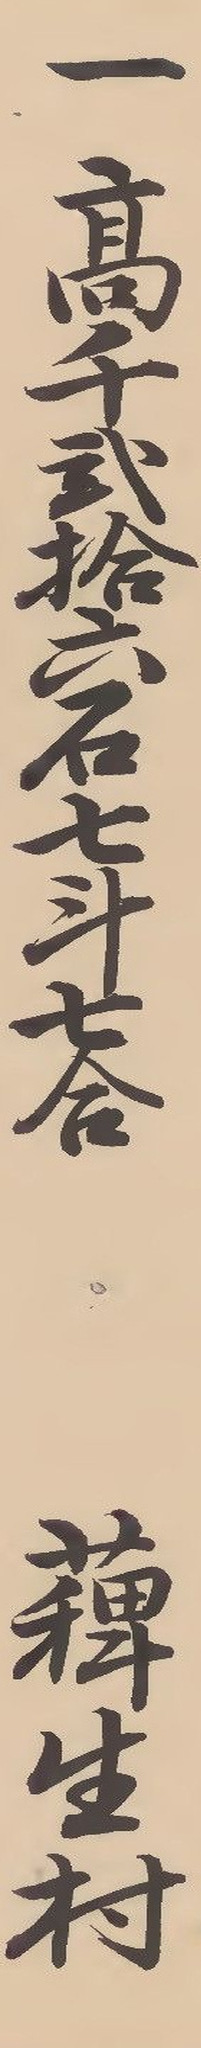一高千弐拾六石七斗七合薭生村
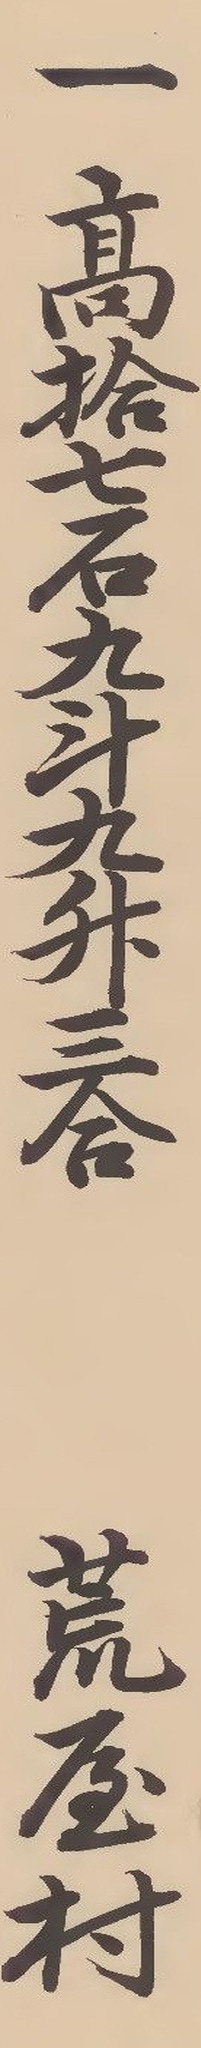一高拾七石九斗九升三合荒屋村
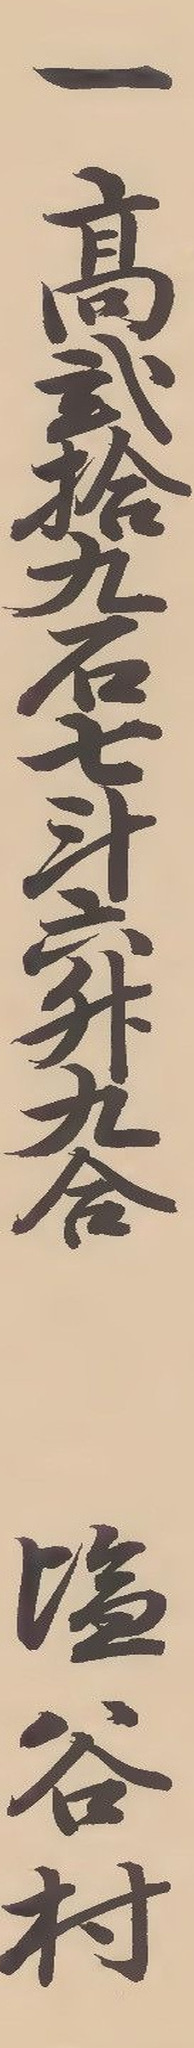一高弐拾九石七斗六升九合塩谷村
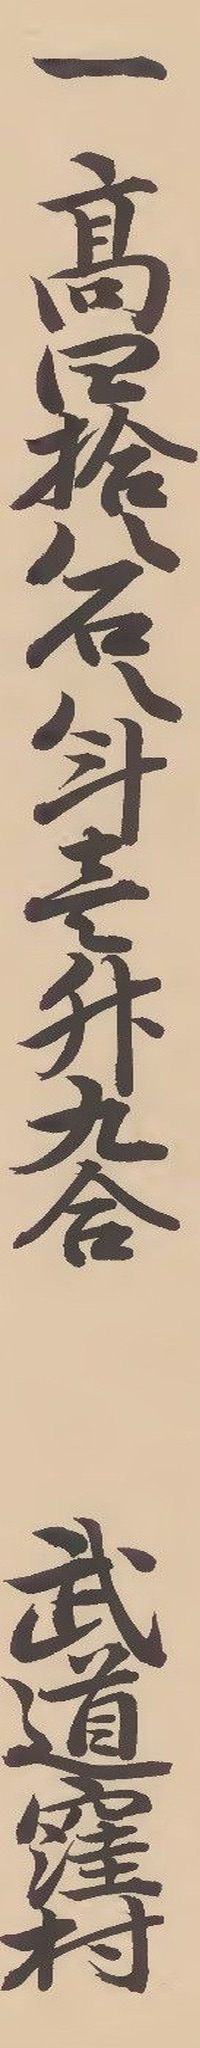一高四拾八石八斗壱升九合武道窪村
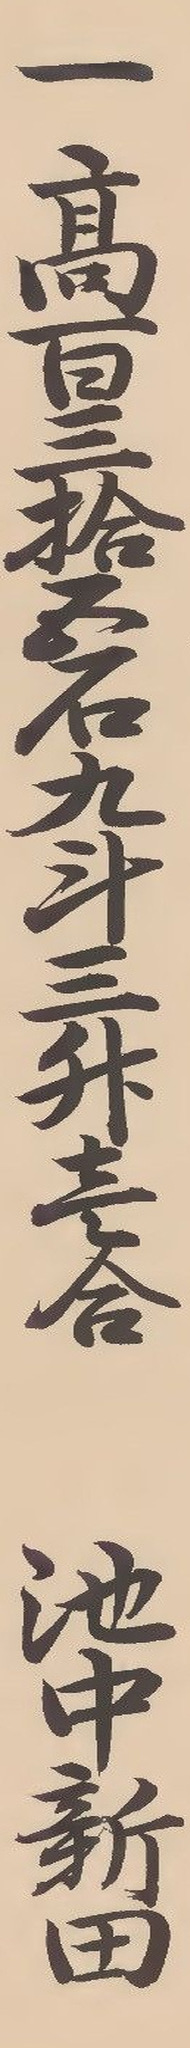一高百三拾五石九斗三升壱合池中新田
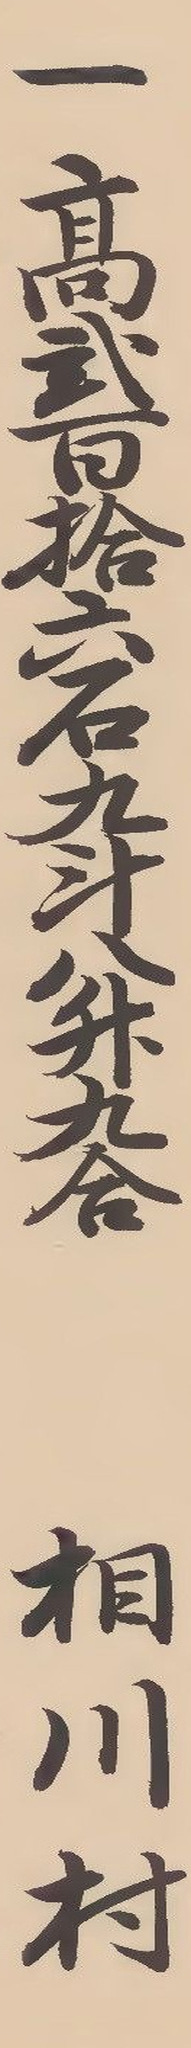一高弐百拾六石九斗八升九合相川村
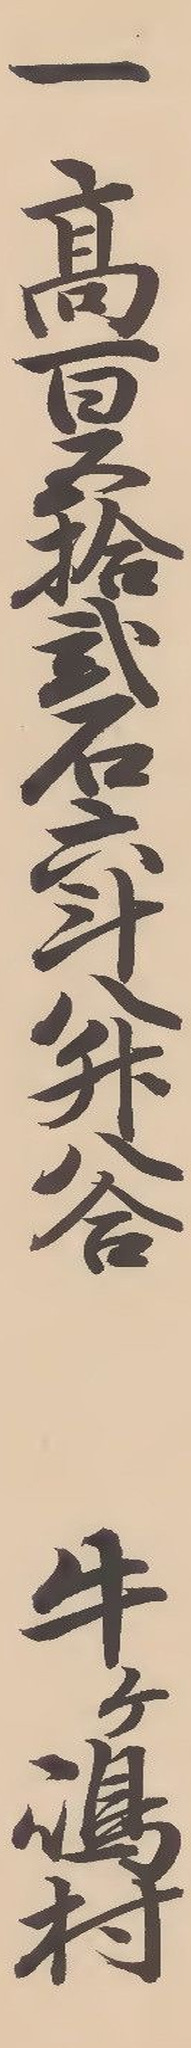一高百五拾弐石六斗八升八合牛ヶ島村
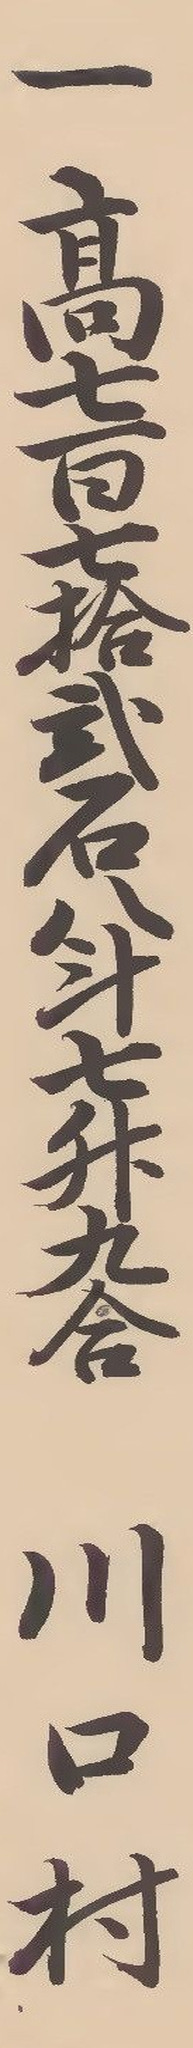一高七百七拾弐石八斗七升九合川口村

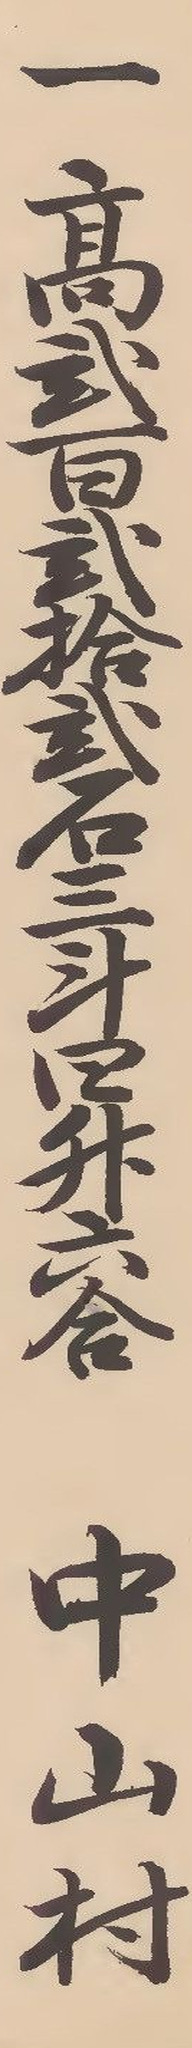一高弐百弐拾弐石三斗四升六合中山村
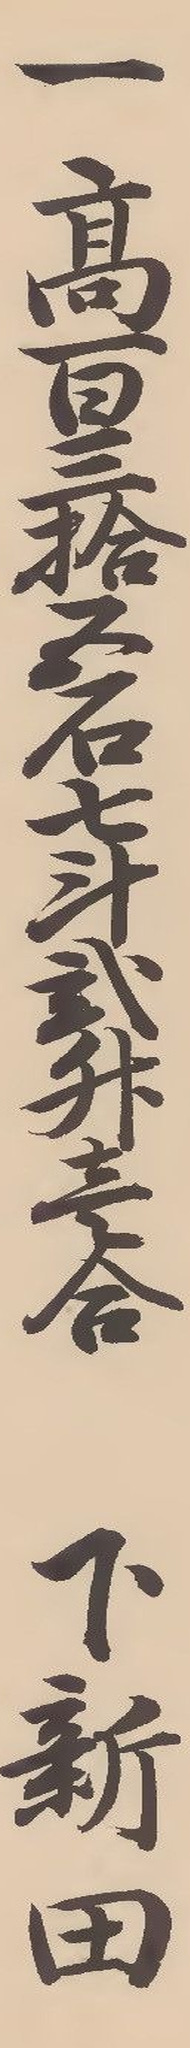一高百三拾五石七斗弐升壱合下新田
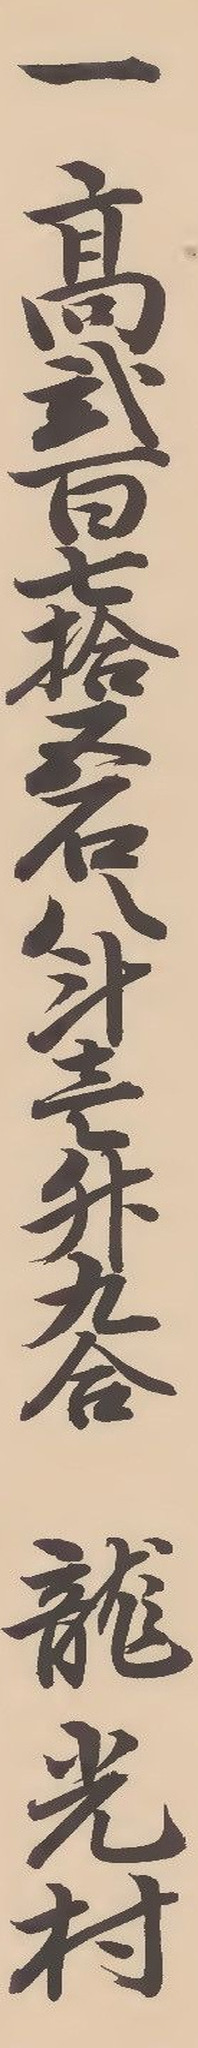一高弐百七拾五石八斗壱升九合竜光村
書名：越後国郷帳　中
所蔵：国立公文書館 National Archives of Japan
